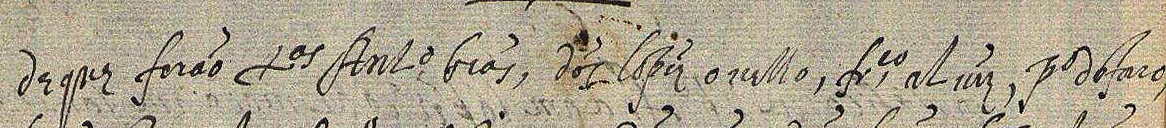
de que foraõ tas Anto bras, dōs lopēz o uelho, frco alur̄z, po do faro,
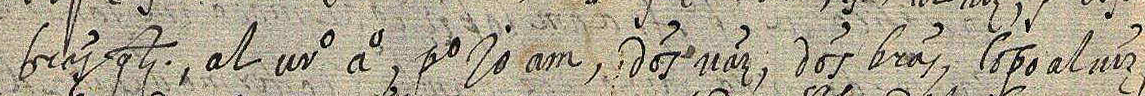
bras gl̄z., aluro ao, po Joam, dos̄ uāz, dōs bras, lopo aluēz,
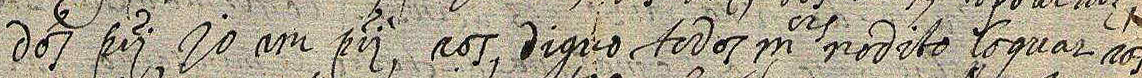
dōs piz̄, Joam pīz, aos, diguo todos mors no dito loguar aos
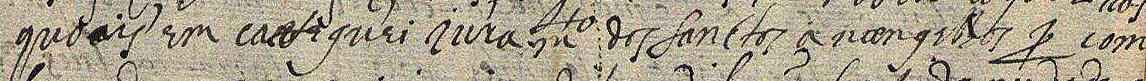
quoais EmcaReguei iuramto dos sanctos auangelhos ꝑ com
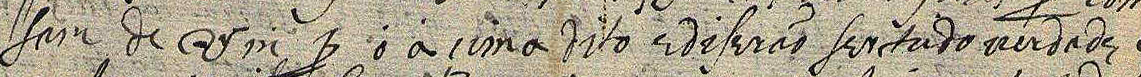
sam de vm ꝑ o acima dito E diserão ser tudo uerdade e
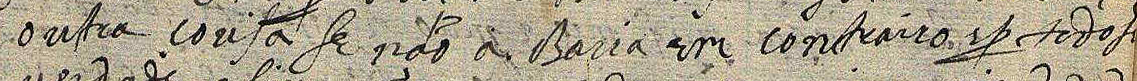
outra cousa se naõ acharia Em contrairo e ꝑ todo s
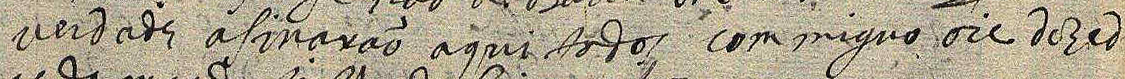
uerdade asinaraõ aqui todos commiguo oie doze d
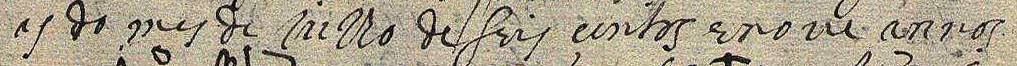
as do mes de Julho de seiscentos E noue annos
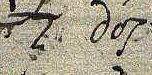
dōs
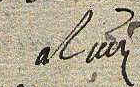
aluēz
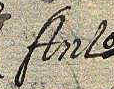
Anto
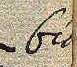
bra
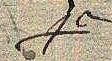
ta
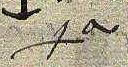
ta
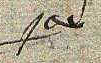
ta
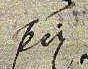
pīz
